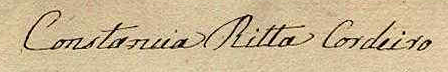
Constancia Ritta Cordeiro
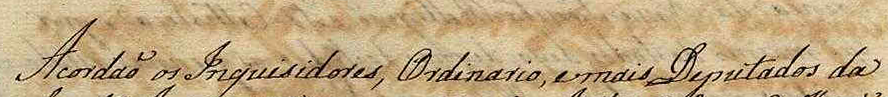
Acordaõ os Inquisidores, Ordinario, e mais Deputados da
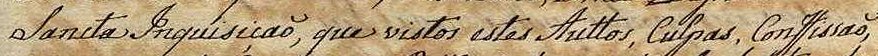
Sancta Inquisiçaõ, que vistos estes Auttos, Culpas. Conffissaõ,
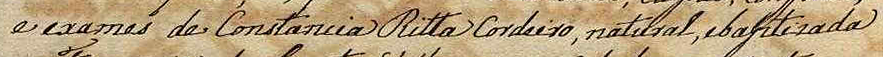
e exames de Constancia Ritta Cordeiro, natural, e baptizada
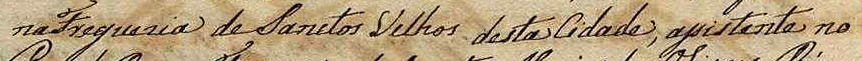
na Freguezia de Sanctos Velhos desta Cidade, assistente no
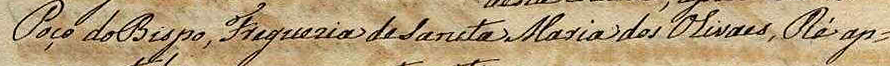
Poço do Bispo, Freguezia de Sancta Maria dos Olivaes, Ré ap
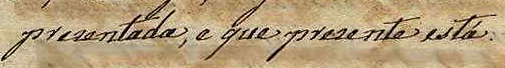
prezentada, e que prezente está.
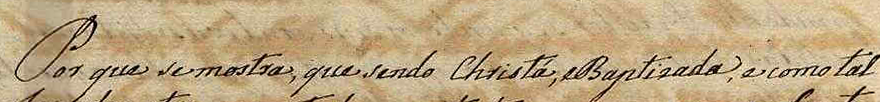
Por que se mostra, que sendo Christá, e Baptizada, e como tal
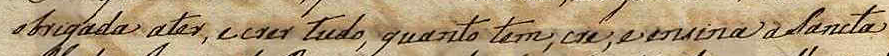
obrigada a ter, e crer tudo, quanto tem, cre, e ensina a Sancta
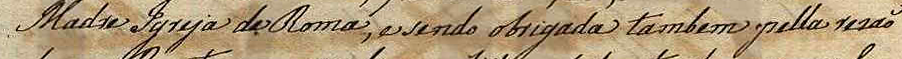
Madre Igreja de Roma, e sendo obrigada tambem pella rezaõ
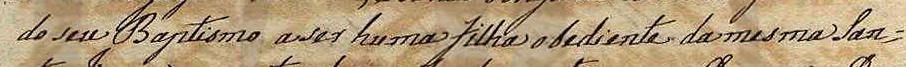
do seu Baptismo a ser huma filha obediente da mesma San
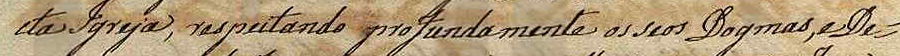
cta Igreja, respeitando profundamente os seos Dogmas, e De
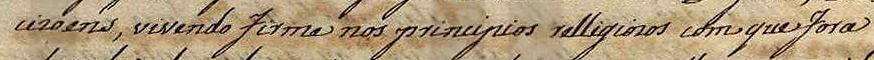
cizoens, vivendo firme nos principios relligiozos com que fora
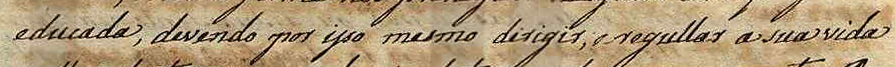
educada, devendo por isso mesmo dirigir, e regullar a sua vida
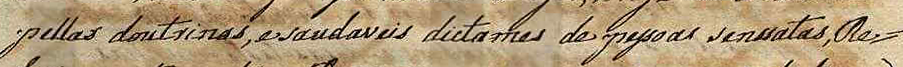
pellas doutrinas, e saudaveis dictames de pessoas senssatas, Re
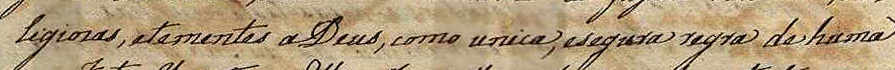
ligiozas, e tementes a Deus, como unica, e segura regra de huma
